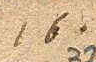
16.
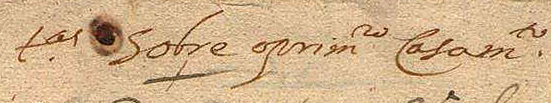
t.as sobre o primro Casamto.
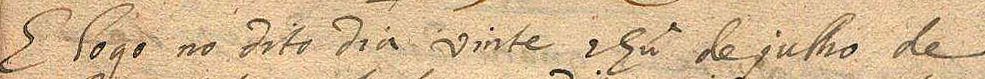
E logo no dito dia vinte E hū de julho de
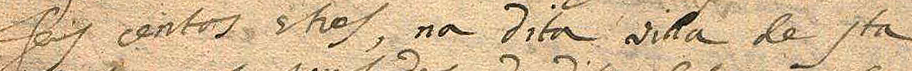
seiscentos E tres, na dita villa de sta
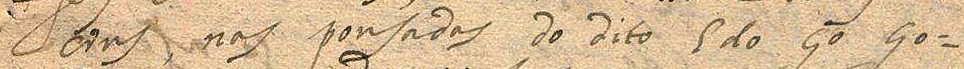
crus, nas pousadas do dito Ldo Go Go
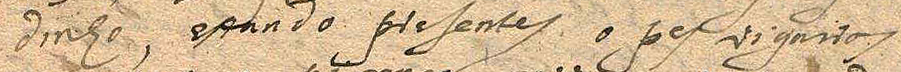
dinho, estando presentes o pes vigarios
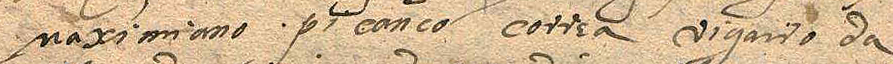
maximiano picanço correa vigairo da
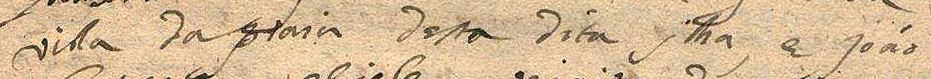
villa da praia desta dita jlha, e João
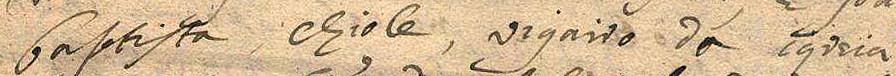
baptista chiole, vigairo da igreia
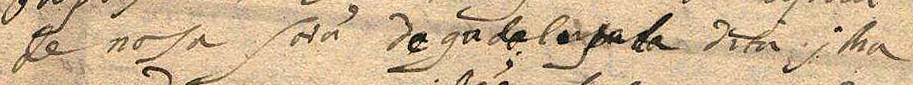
de nosa sorā de gadalupe da dita jlha
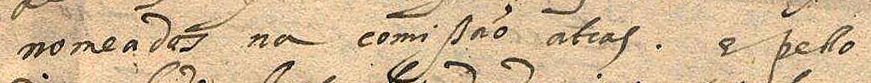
nomeados na comissaõ atras. E pello
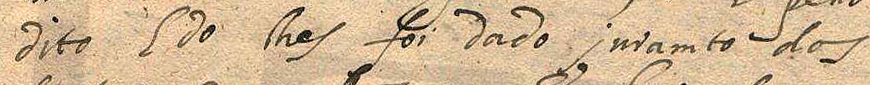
dito ldo lhes foi dado juramto dos
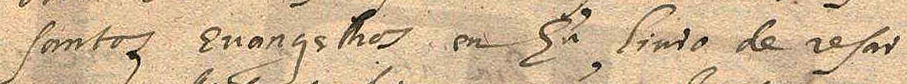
santos Euangelhos em hū liuro de resas
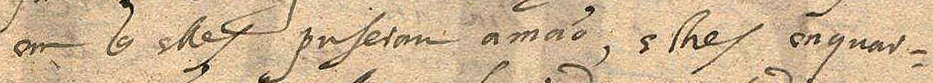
em q̄ elles puseram a maõ, E lhes enquar
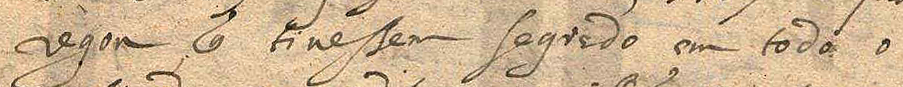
regou, q̄ tiuessem segredo em todo o
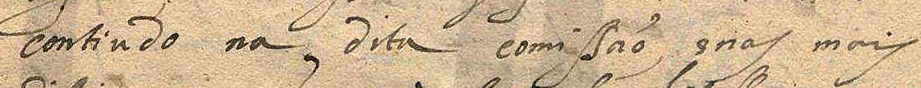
contiudo na dita comissaõ, e nas mais
